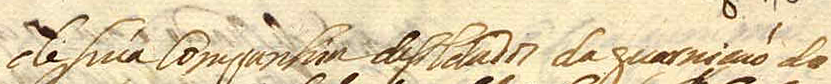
de huā Companhia de Soldados da guarniçaõ do
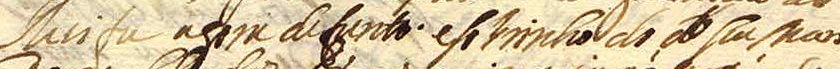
Recife agora defunto. e sobrinho do d̄o Seu mari
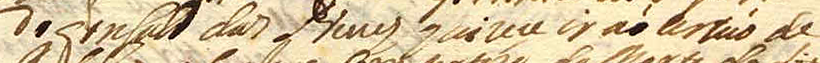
do gonsalo das Neues quizeçe ir ao certão de
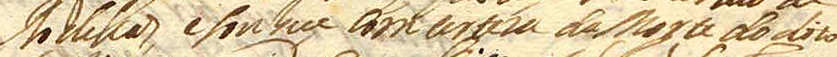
Rodellas, e soubeçe com certeza da Morte do dito
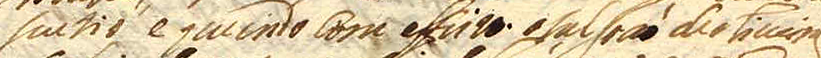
seu tio, e que indo com effeito. o tal Joaõ de oliueira
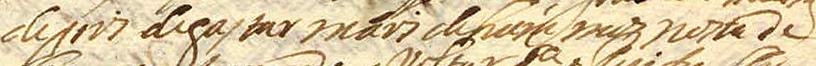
depois de gastar mais de hum mez nesta de
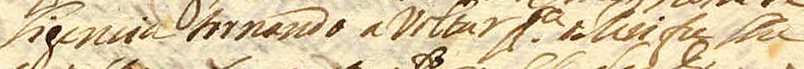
ligencia tornando a voltar p.a o Recife lhe
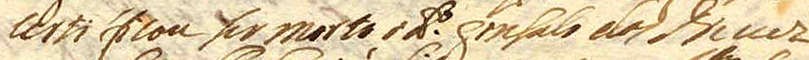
certificou ser morto o d̄.o gonsalo das Neuez
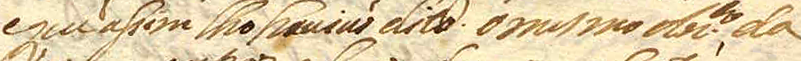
e que assim lho hauiaõ dito o mesmo An.to da
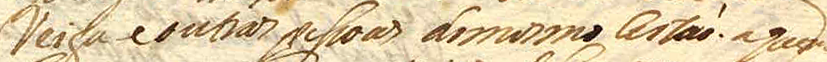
Veiga e outras pessoas do mesmo certaõ a quem
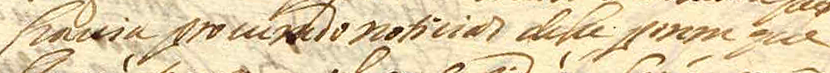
hauia procurado noticias delle porem que
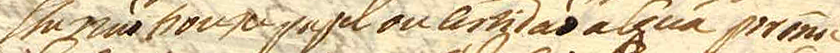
lhe não trouxe papel ou certidaõ alguā por onde
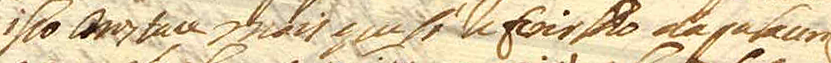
isso constace mais que só Referirlho da palaura
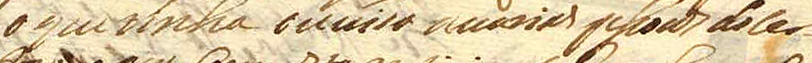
o que tinha ouuido a uarias pessoas do cer
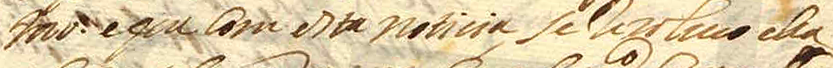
tao. e que com esta noticia se rezolueo ella
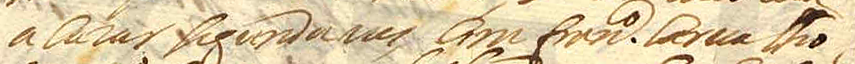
a cazar segunda ues Com franco. Carualho,
